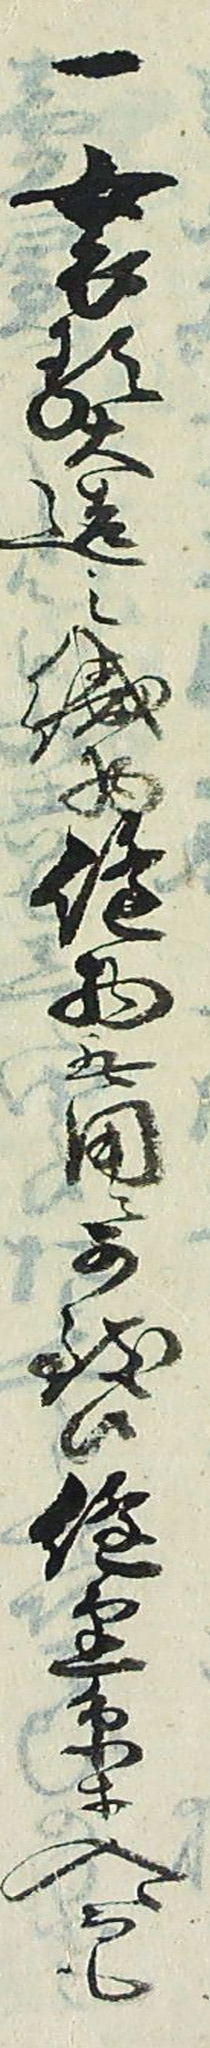一女衣類大造之織物縫物無用に可致候縫金糸等入候而も
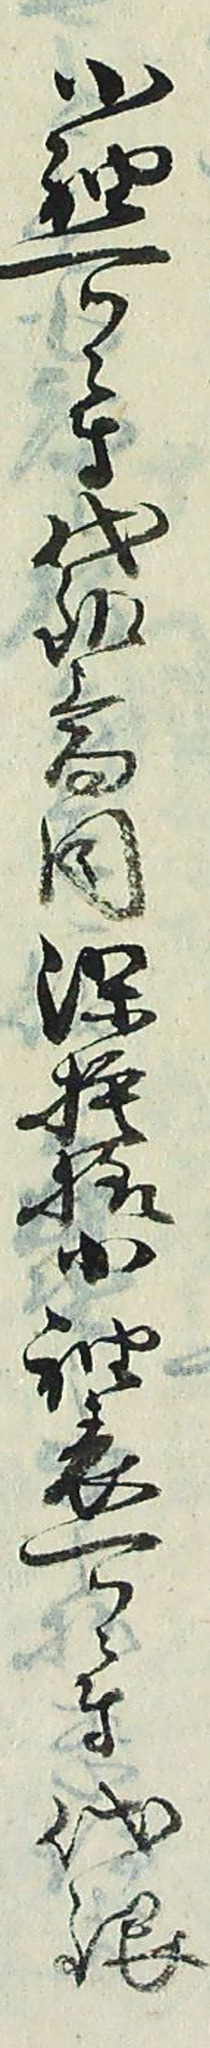小袖一つに付代銀三百目染模様小袖表一つに付代銀
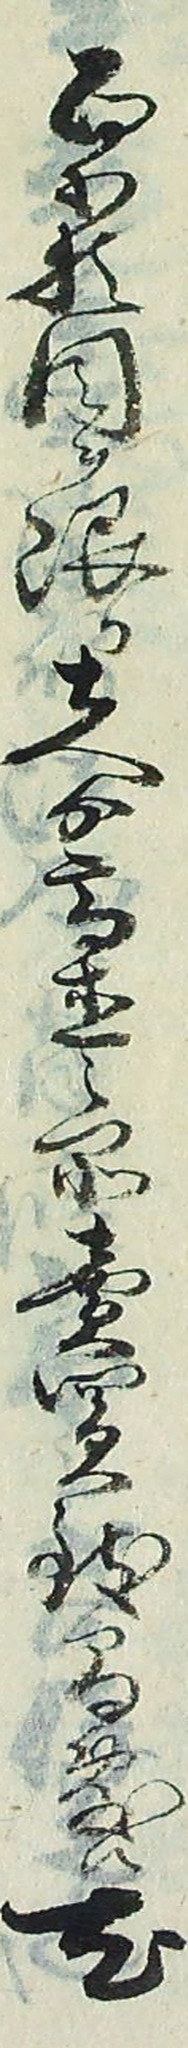百五拾目を限り夫ゟ高直之品売買致間敷候尤
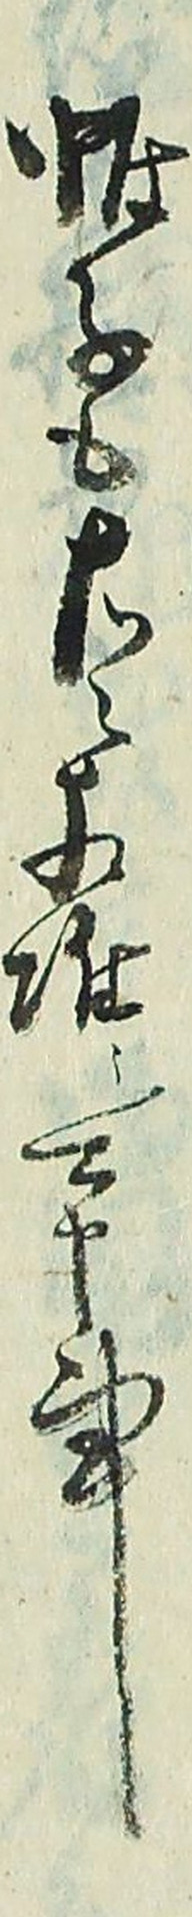帷子も右に相准し可申事
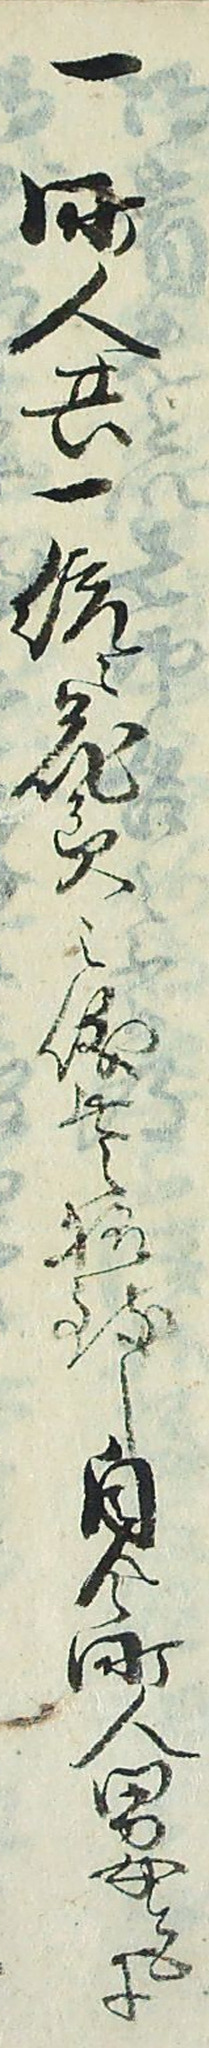一町人共一統に花美之儀無之様致し自今町人男女ともに
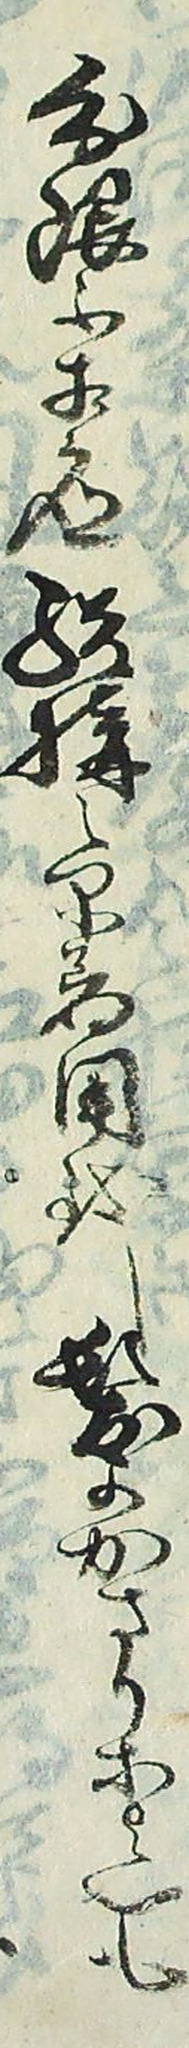分限不相応結構之品着用致し髪のかさり等迄も
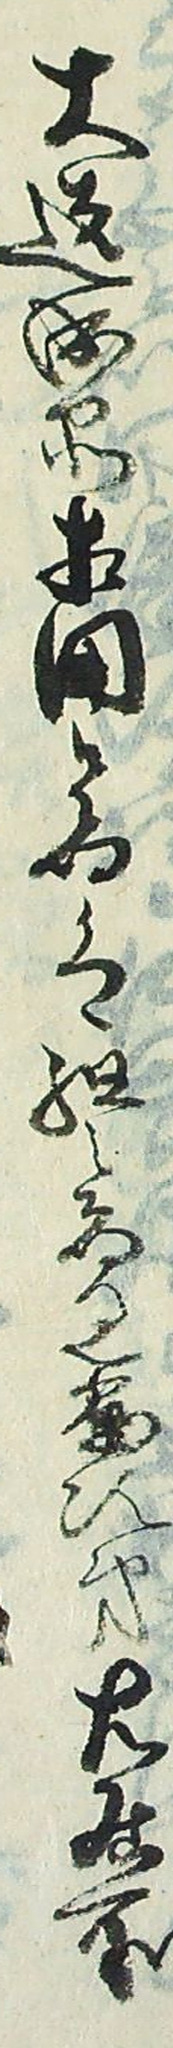大造成品相用候者候はゝ組之者見当次第右居所
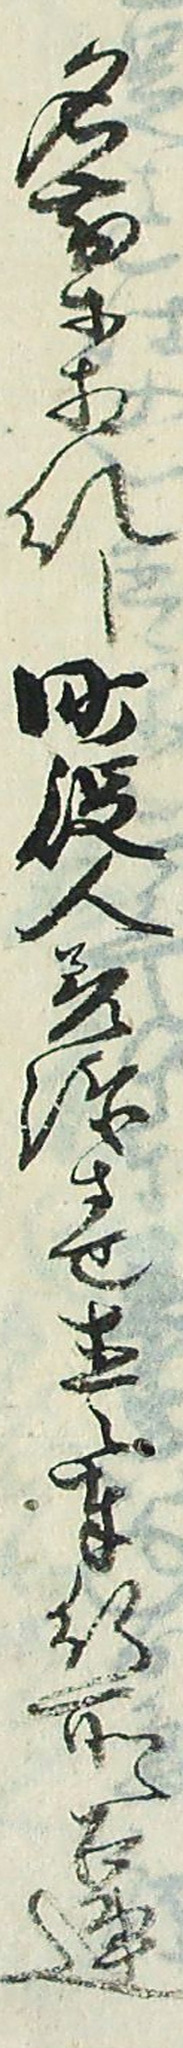名前等相糺し町役人差添させ直に奉行所へ召連

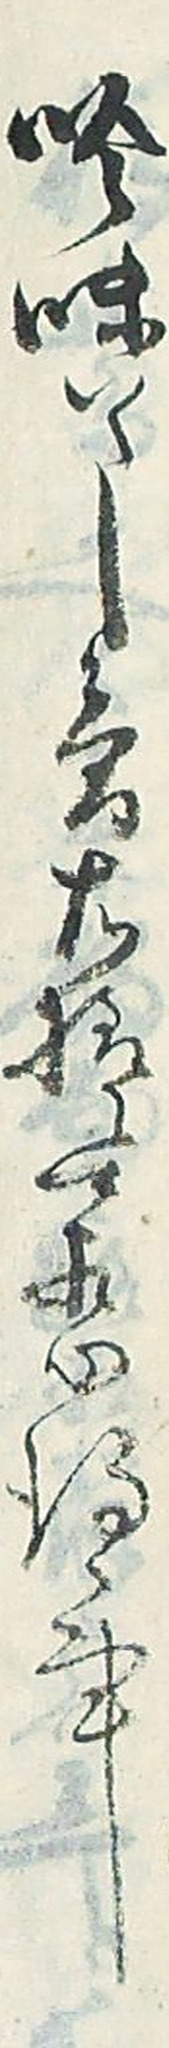吟味いたし候間右様に可相心得候事
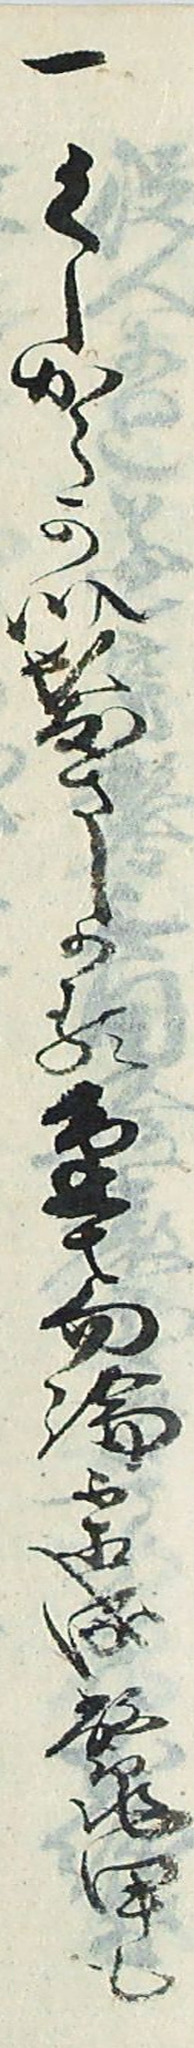一くしかうかい髪さしの類金は勿論不相成鼈甲も
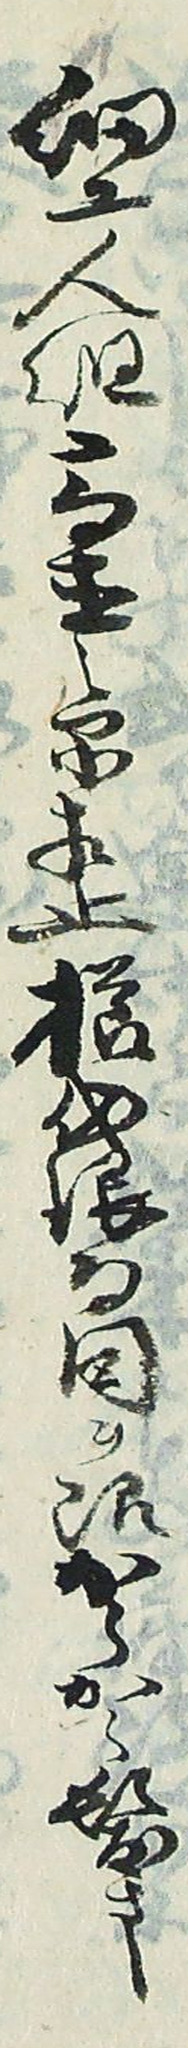細工人組高直之品相止櫛代銀百目を限かうかい髪さし
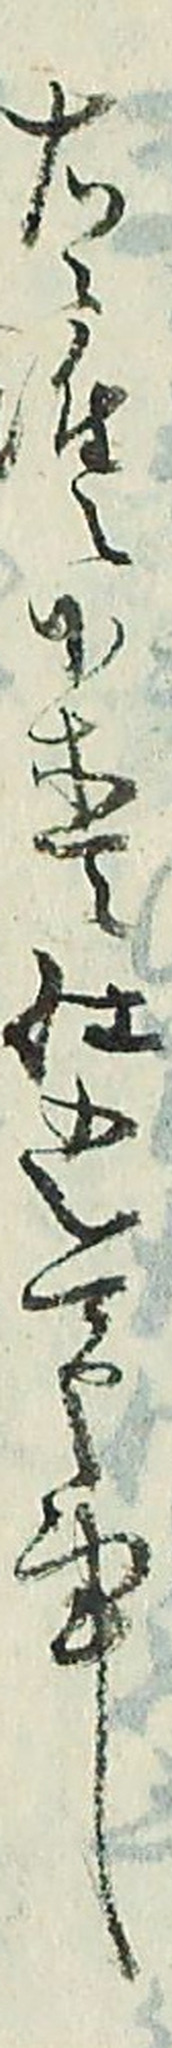右に准し下直に仕込可申事
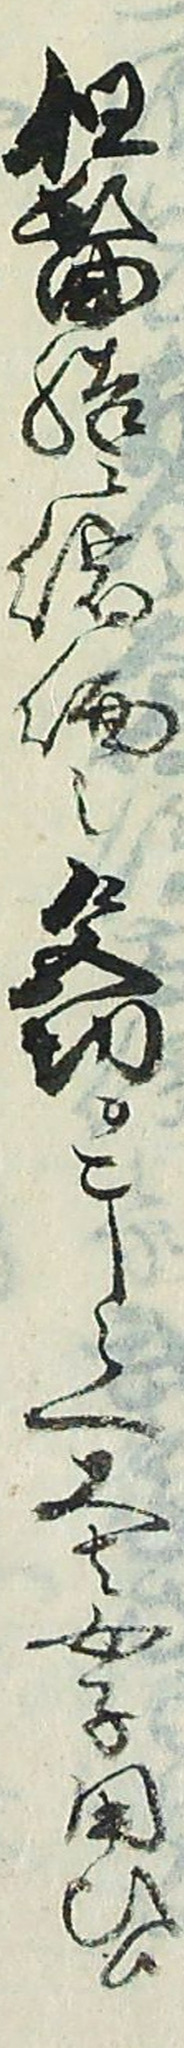但髷結に縮緬之色切をこしらへ又は女子用
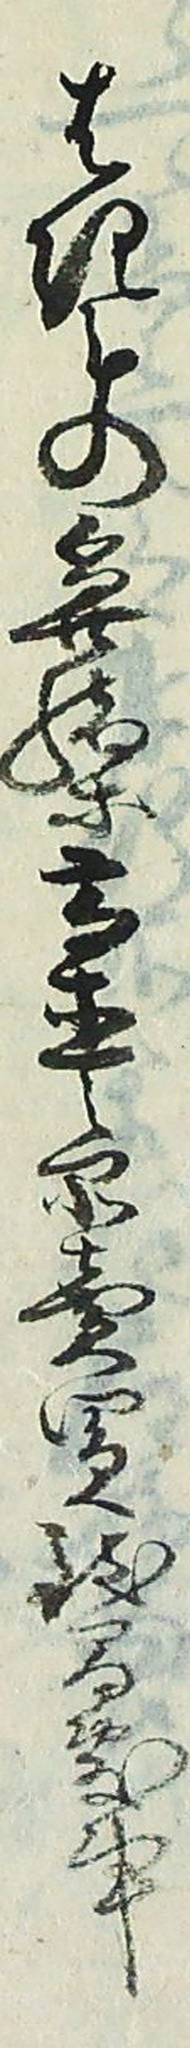はきもの鼻緒等高直之品売買致間敷事
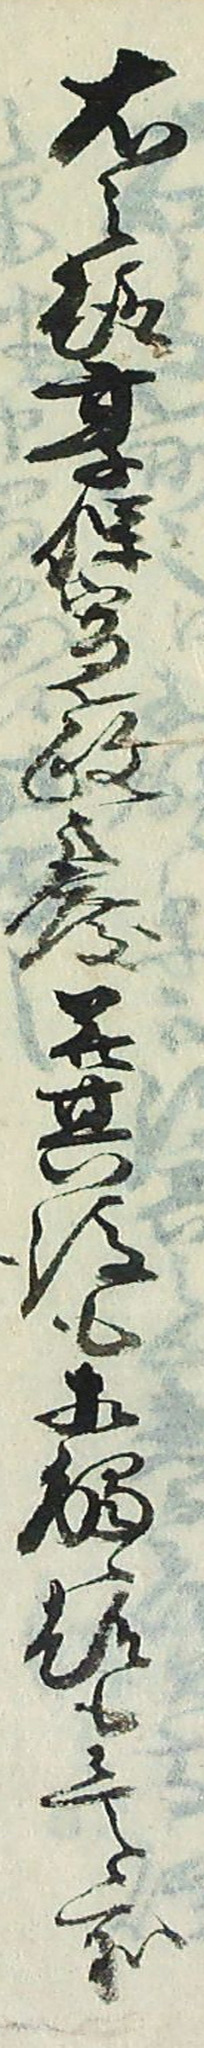右之趣享保寬政之度幷其後も相触候趣も有之候所
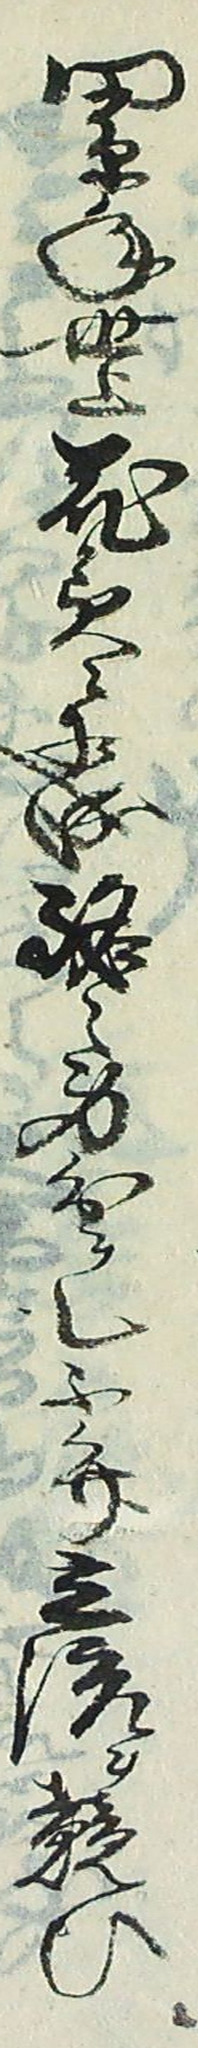累年世上花美に相成銘々身分をも不弁立派を競ひ
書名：諸御用御□受書控
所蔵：鳴門教育大学 Naruto University of Education
